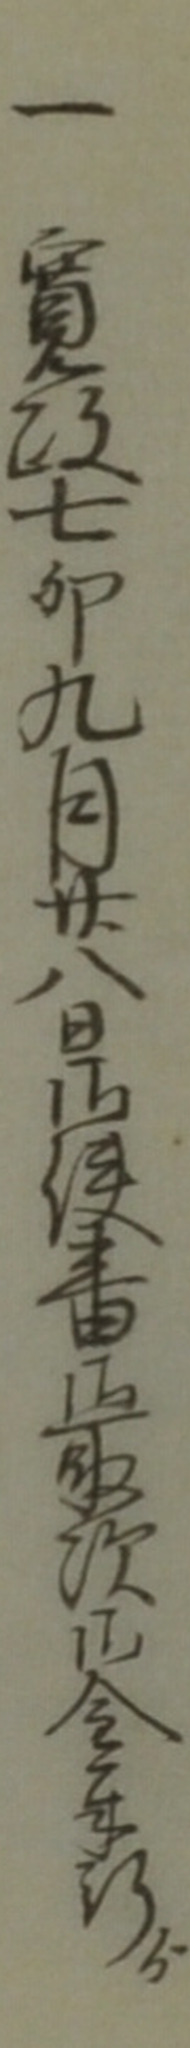一寛政七卯九月廿八日御使御取次御金奉行ゟ
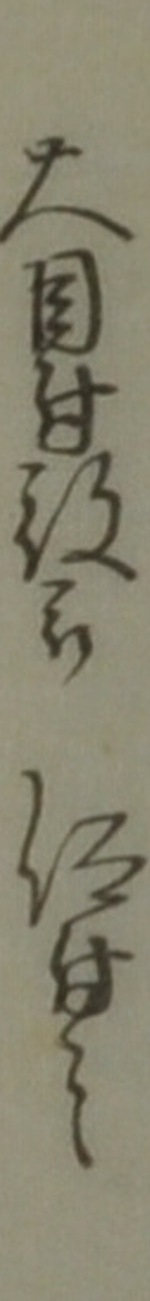大目付役被仰付之
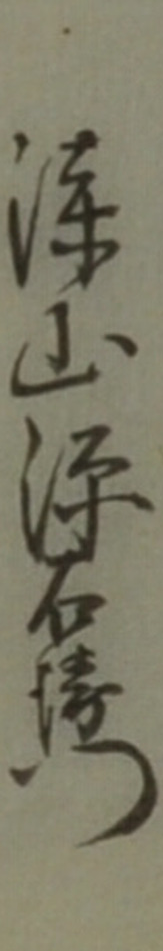漆山源右衛門
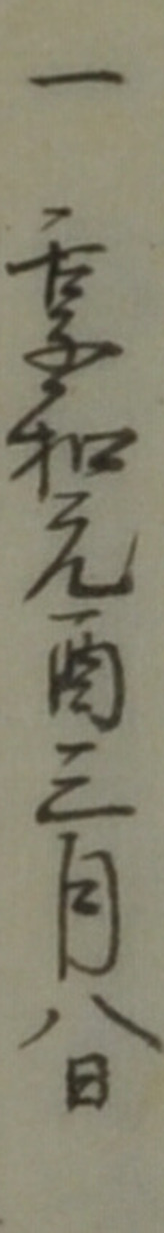一享和元酉三月八日
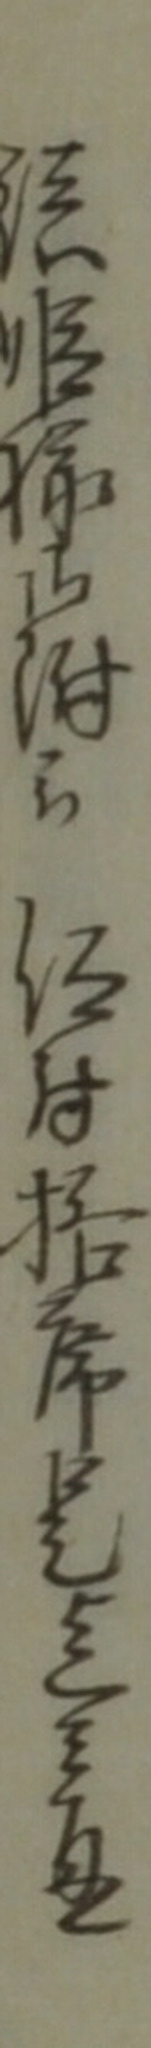鎮姫様御附被仰付格席是迄之通
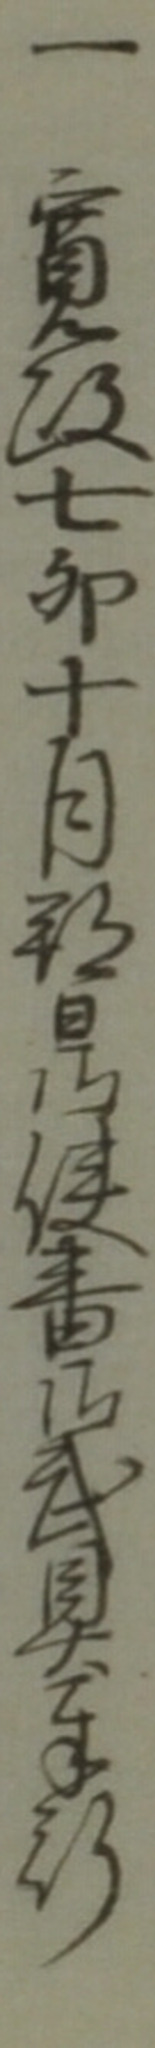一寛政七卯十月朔日御使番御武具奉行
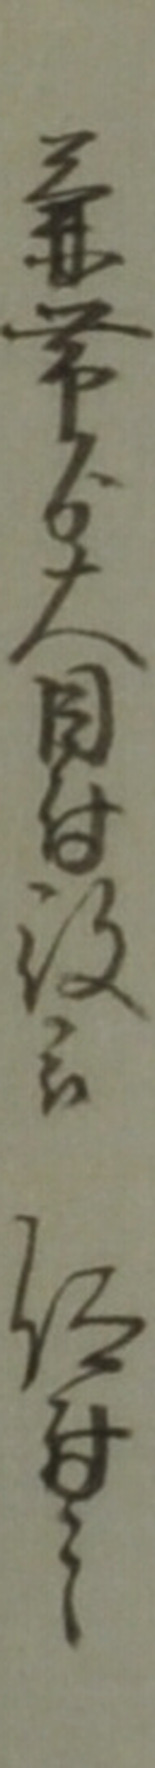目付役ゟ大目付役被仰付之
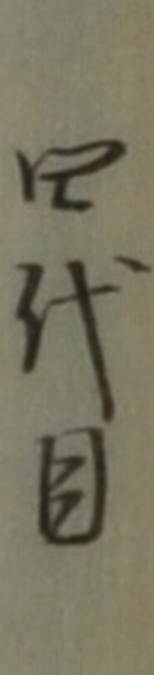四代目
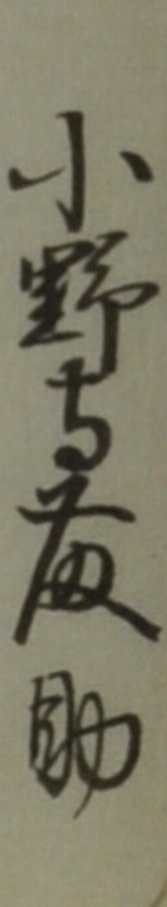小野寺藤助
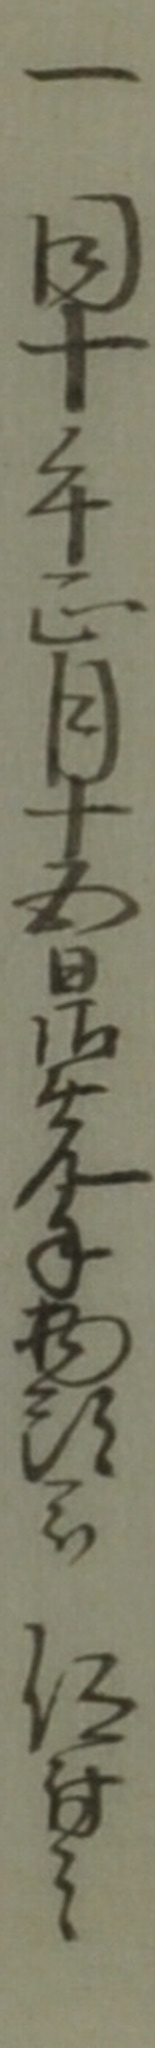一同八辰正月十五日御用役被仰付之
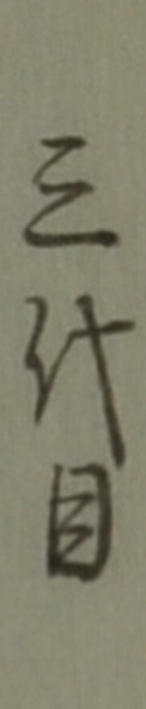五代目
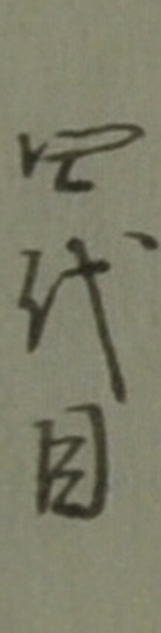四代目
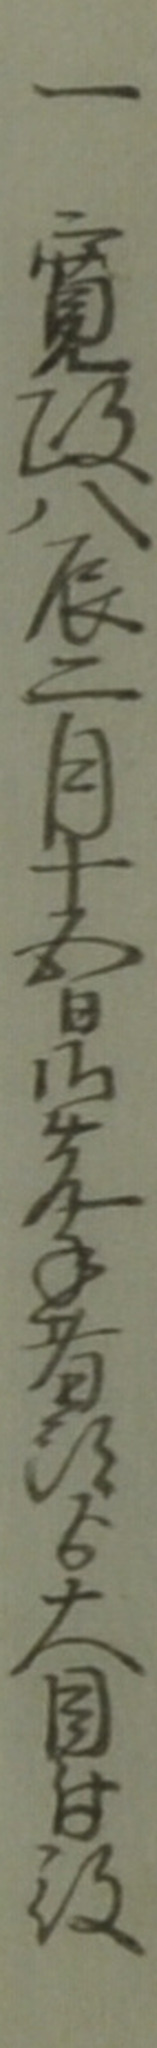兼帯八辰二月十五日御先手者頭ゟ大目付役
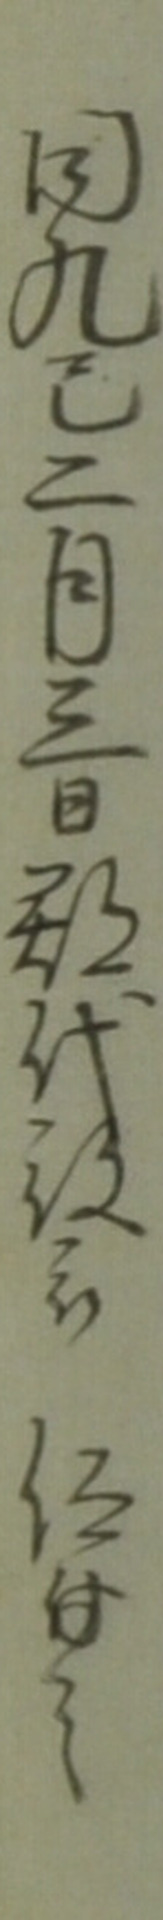一同九己二月三日郡代役被仰付之

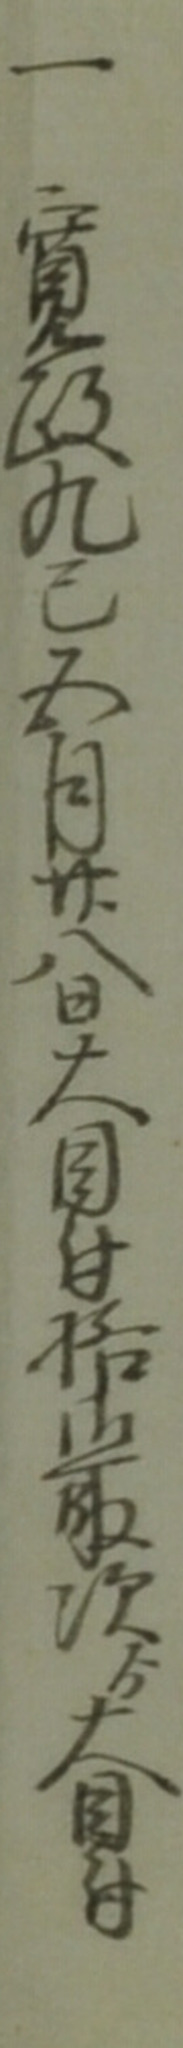一寛政九巳五月廿八日大目付格御取次ゟ大目付
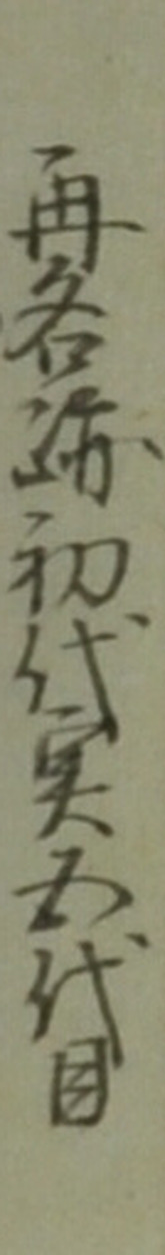再名跡初代実五代目
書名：諸御役代々録（三）
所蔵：伊那市立高遠町図書館・合同会社AMANE
